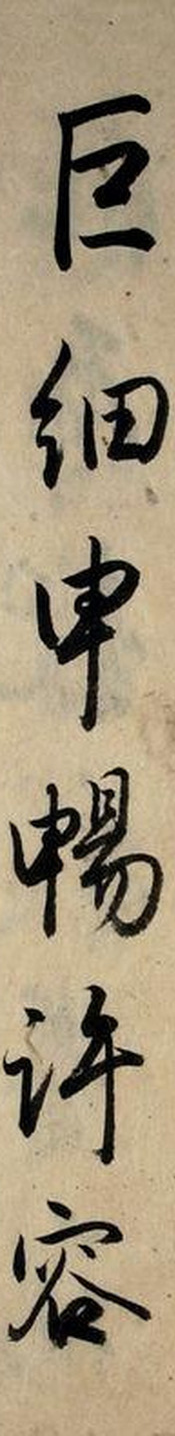巨細申暢許容
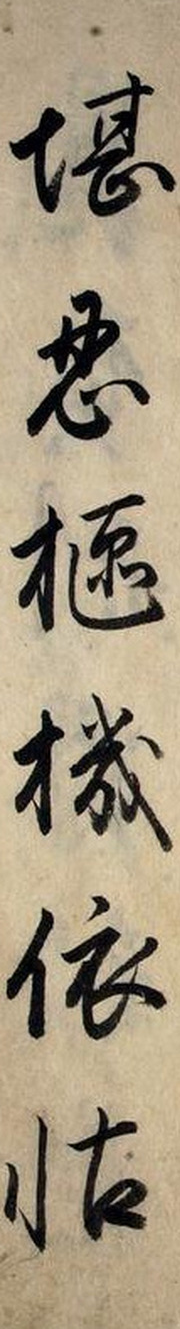堪忍枢機依怙

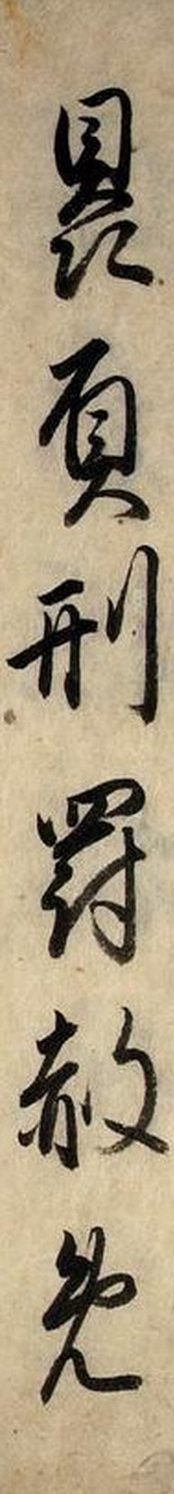贔屓刑罰赦免
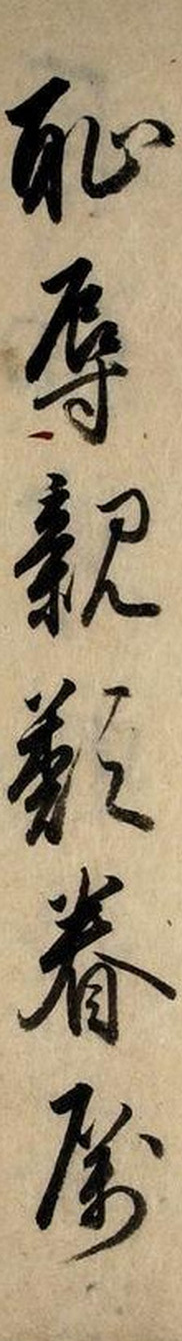恥辱親類眷属
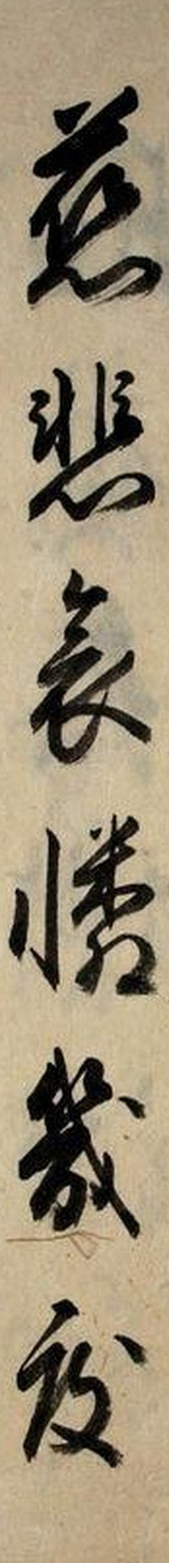慈悲哀憐幾度
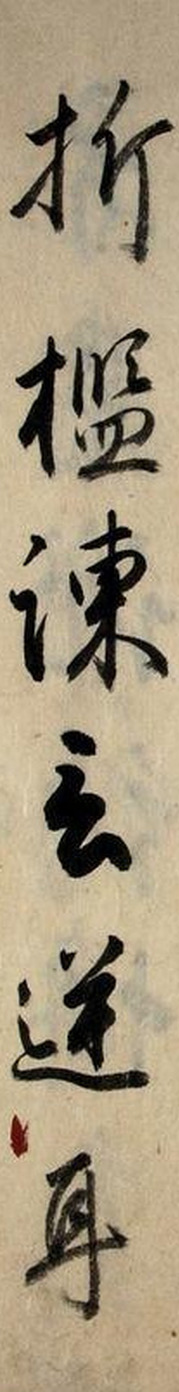折檻諫言逆耳
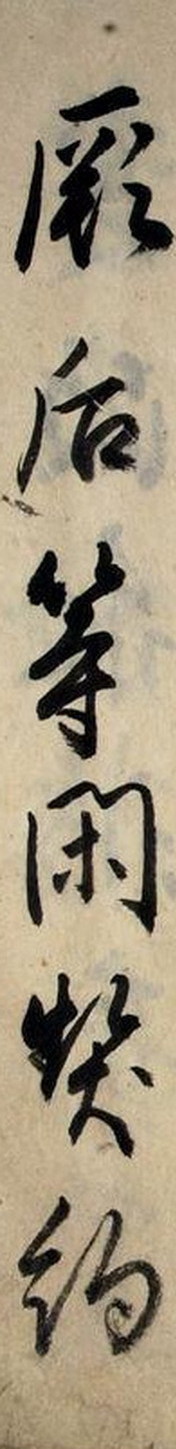厥后等閑契約

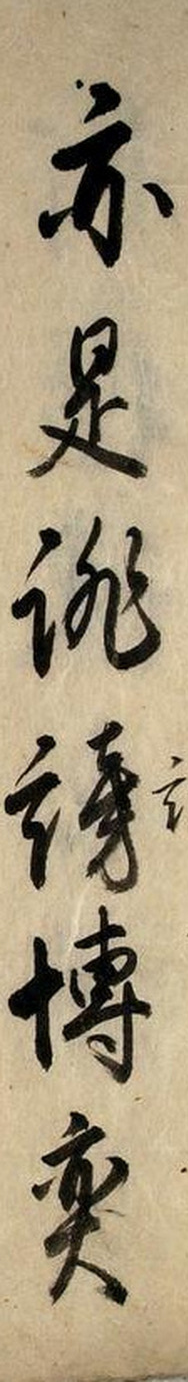亦是誹謗博奕
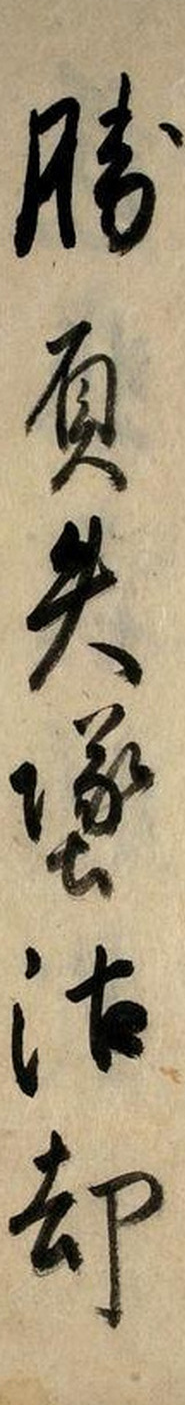勝負失墜沽却
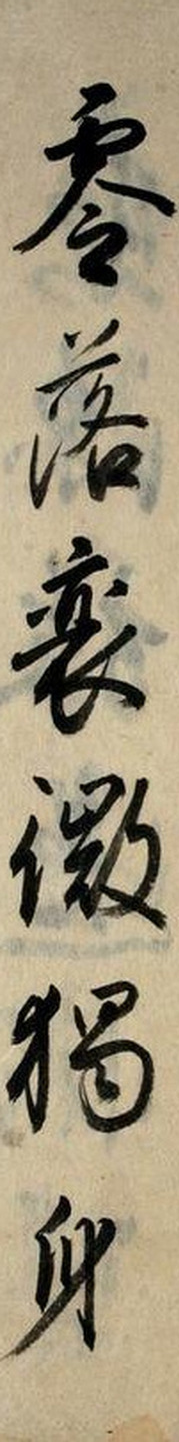零落衰微独身
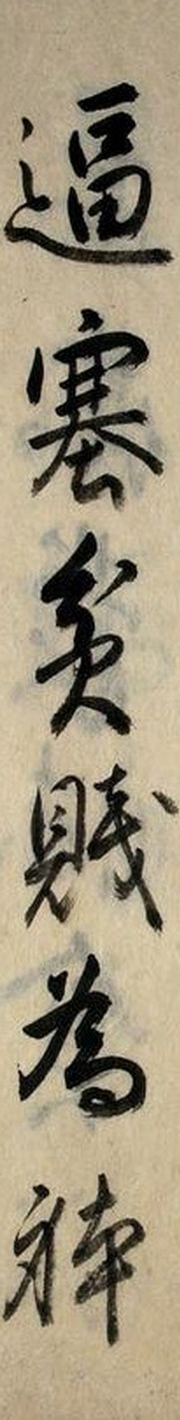逼塞貧賎為体
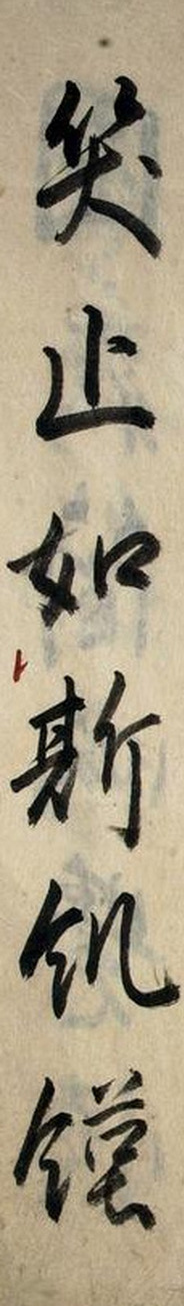笑止如斯飢饉

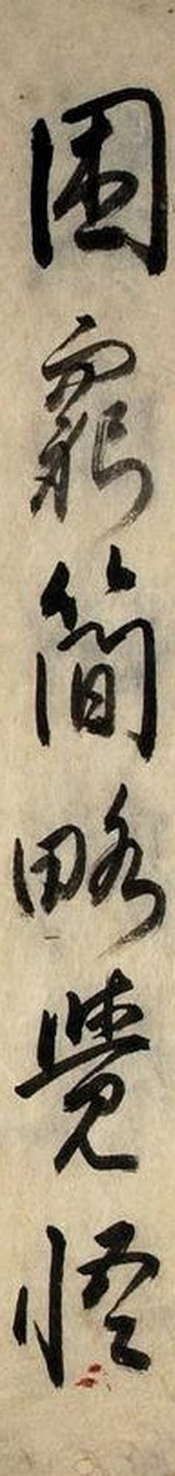困窮簡略覚悟
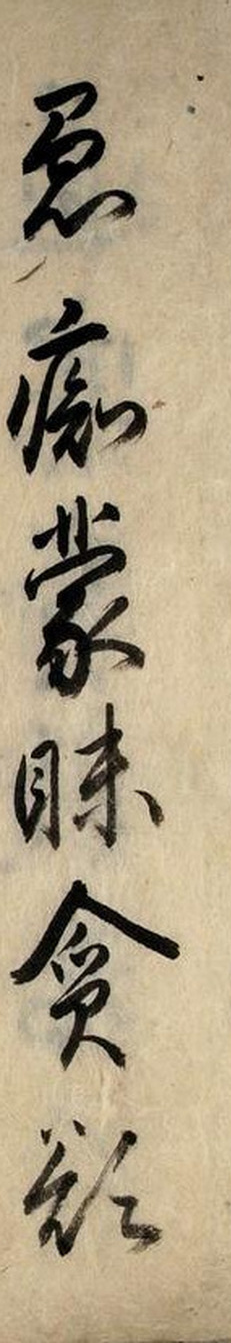愚痴蒙昧貪欲
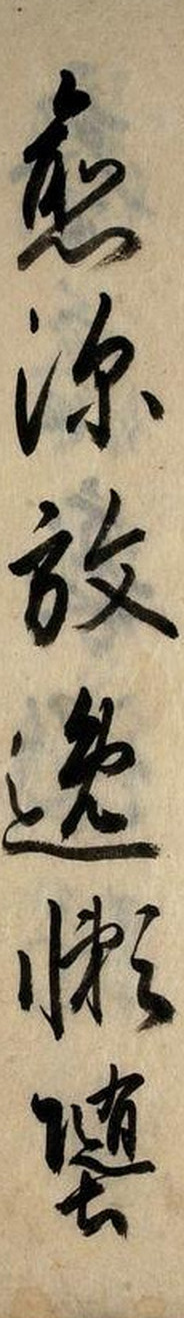愈深放逸懶堕
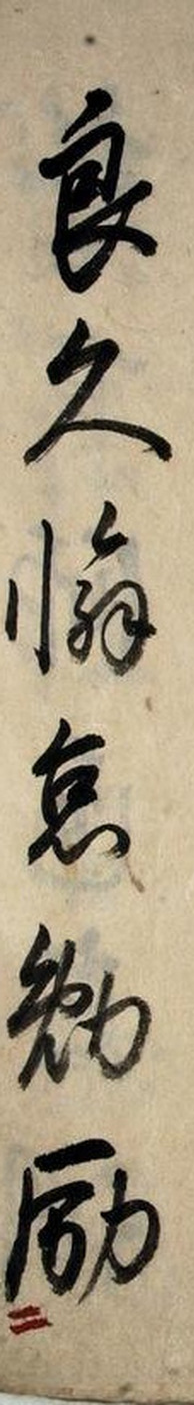良久懈怠勉励
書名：世話千字文（手習手本）
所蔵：福井県文書館 Fukui Prefectural Archives
